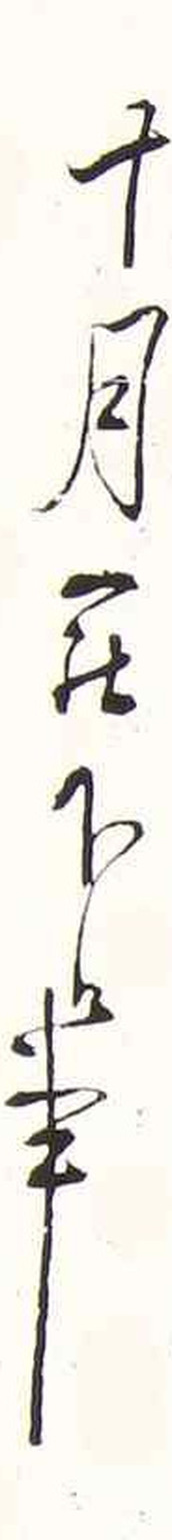十月罷下候事
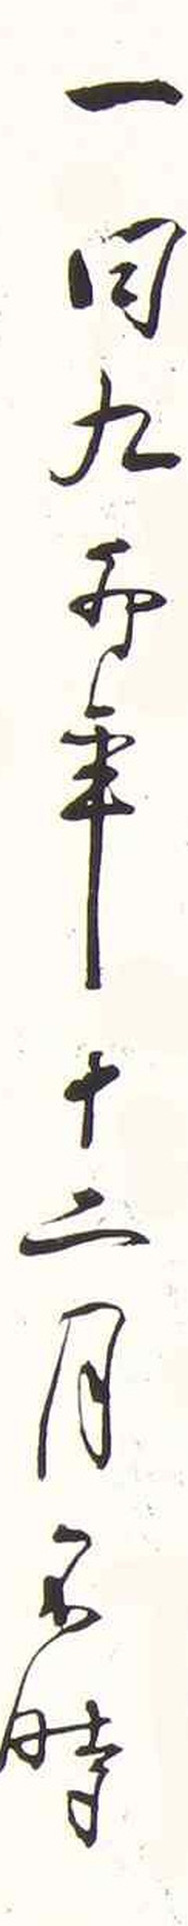一同九卯年十二月不時

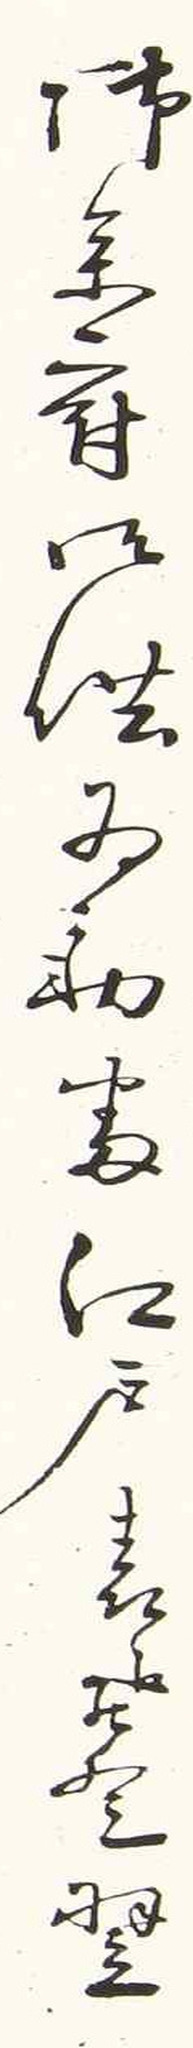御参府御供為勤番江戸表江罷登翌
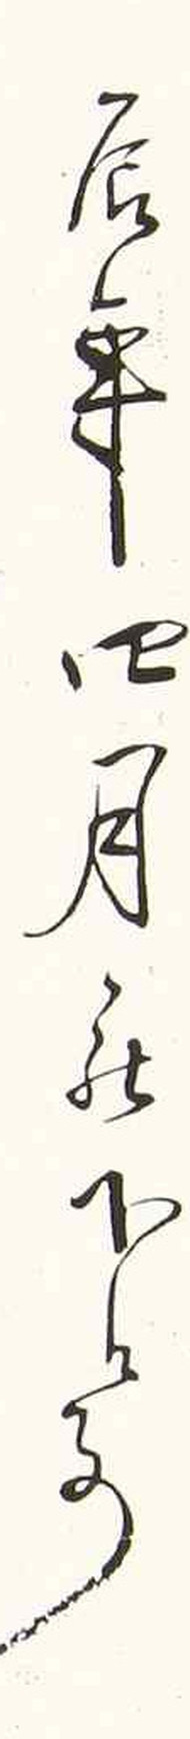辰年四月罷下候事
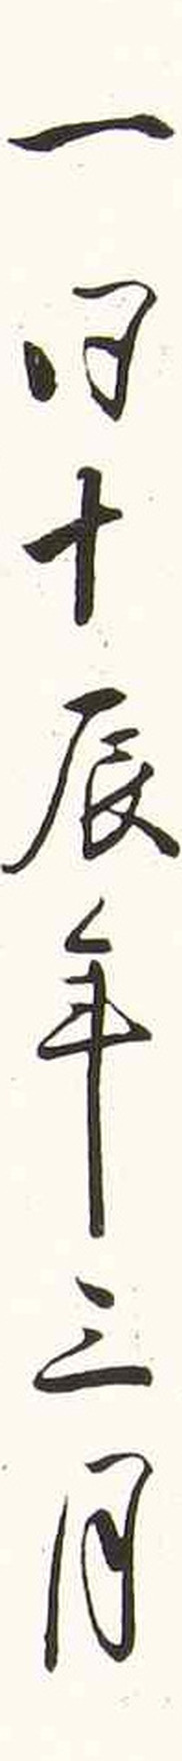一同十辰年三月
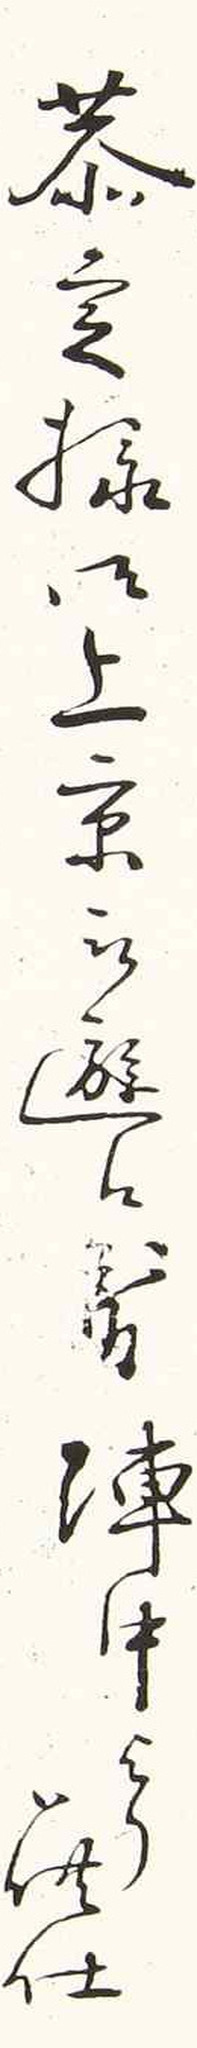恭定様御上京被遊候ニ付陣中より御供仕
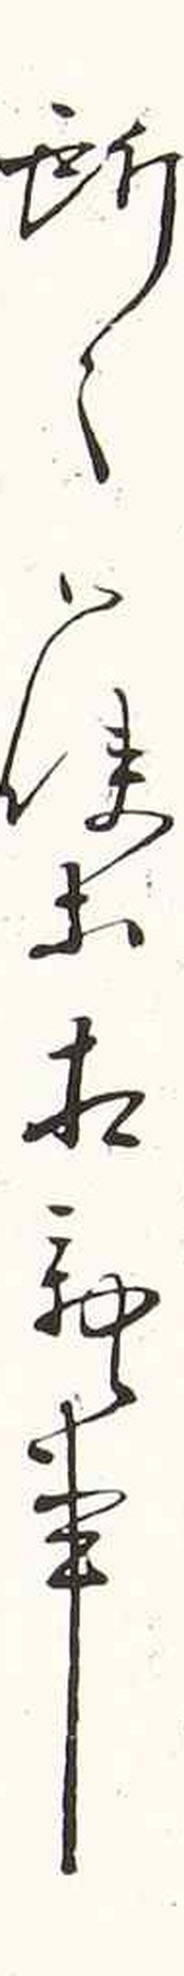所々御使等相勤候事
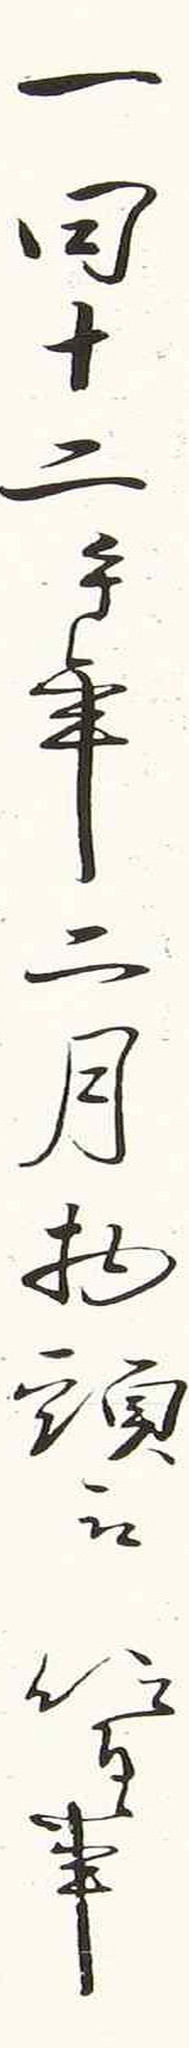一同十二午年二月物頭被仰付候事
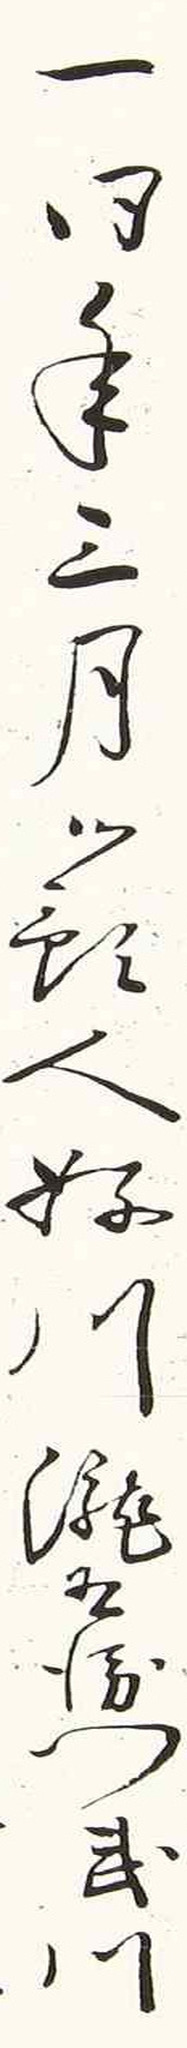一同年三月御預人好川滝右衛門武川
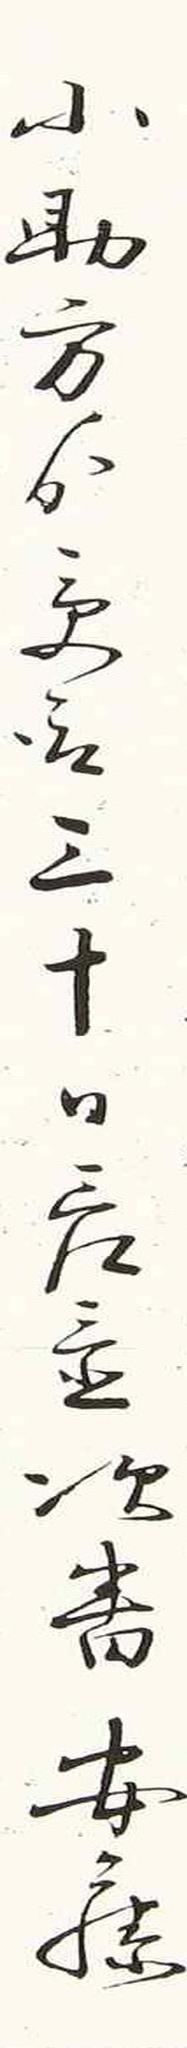小助方ゟ受取三十日差置次番安藤
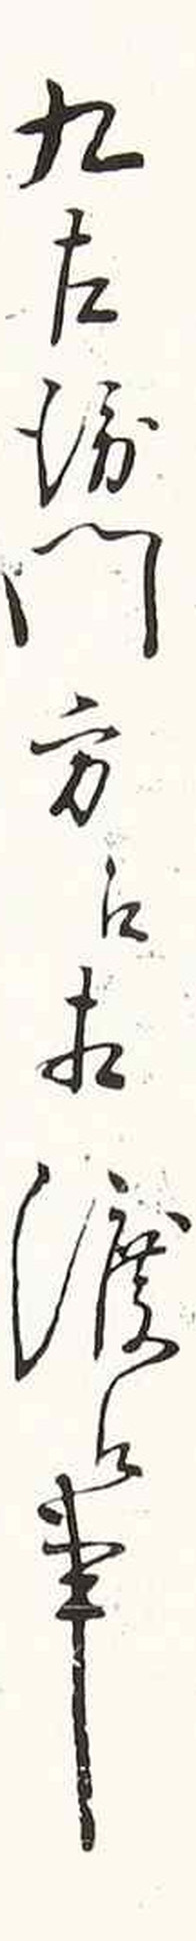九左衛門方江相渡候事
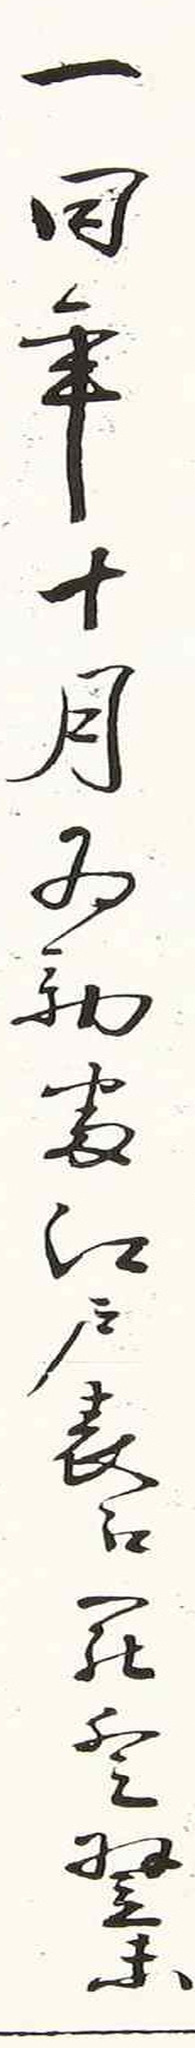一同年十月為勤番江戸表江罷登翌未
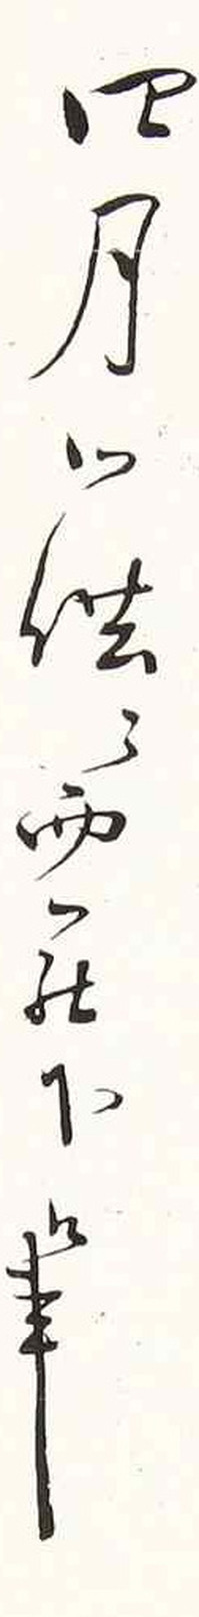四月御供ニ而罷下候事
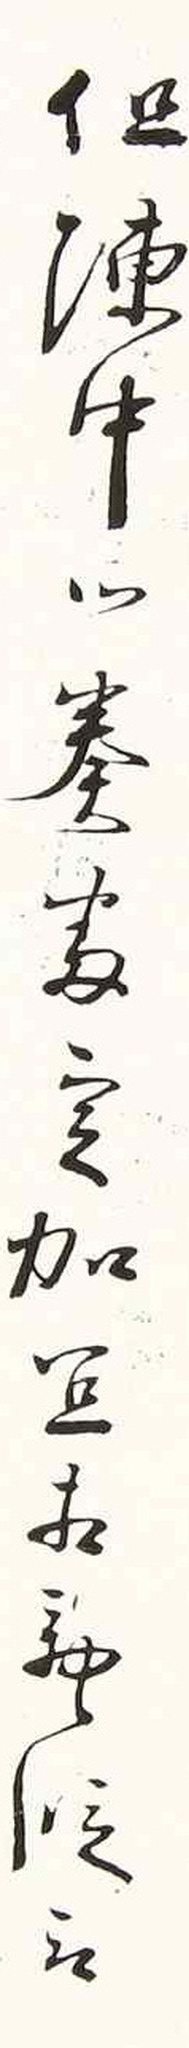但陳中御奏番定加宜相勤候段被
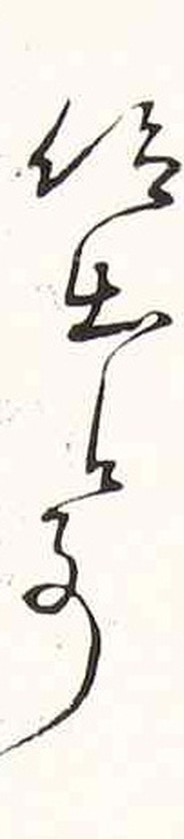仰出候事
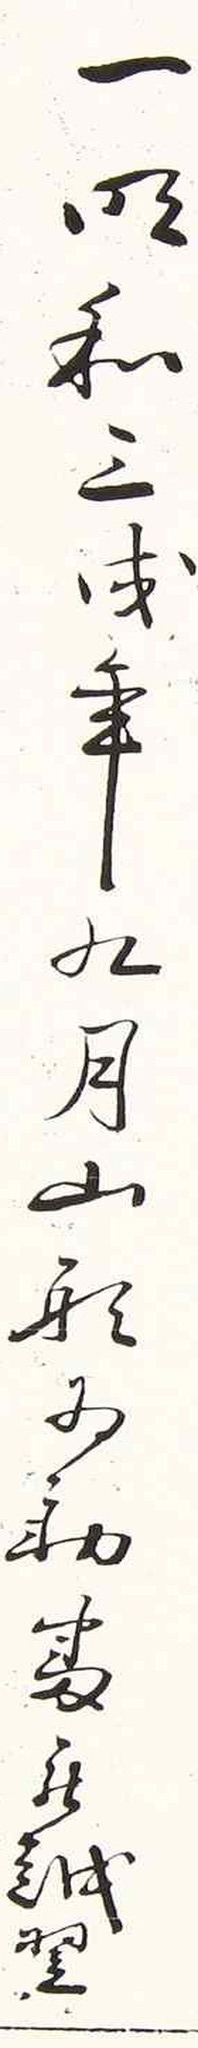一明和三戌年九月山形為勤番罷越翌
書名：諸士系譜　巻之357　す之部7
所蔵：会津若松市立会津図書館
